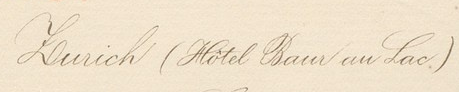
Zurich (Hôtel Baur au Lac)
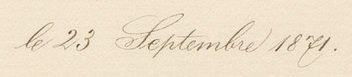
le 23 Septembre 1871.
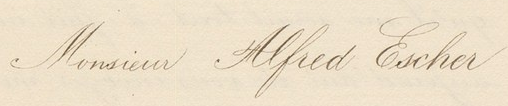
Monsieur Alfred Escher
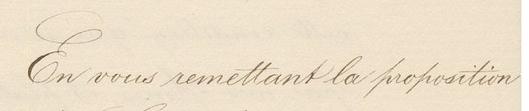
En vous remettant la proposition
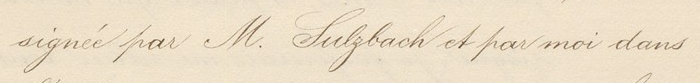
signée par M. Sulzbach et par moi dans
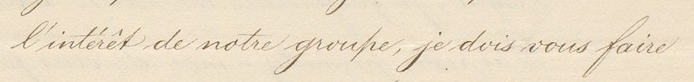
l'intérêt de notre groupe, je dois vous faire
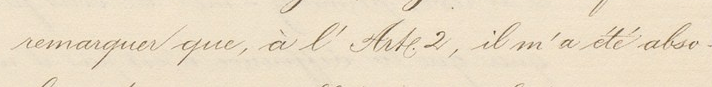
remarquer que, à l'Art. 2, il m'a été abso-
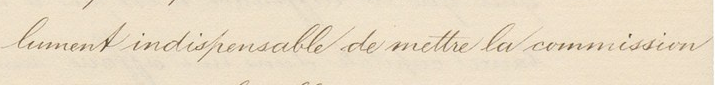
lument indispensable de mettre la commission
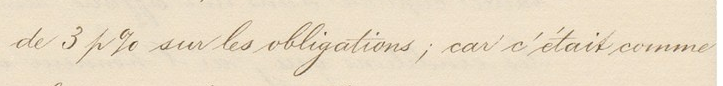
de 3 p% sur les obligations; car c'était comme
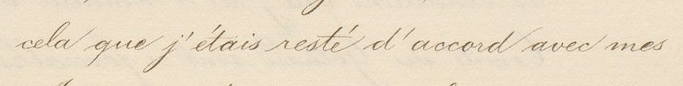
cela que j'étais resté d'accord avec mes
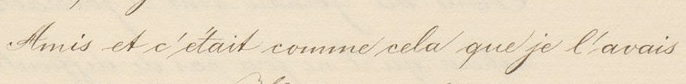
Amis et c'était comme cela que je l'avais
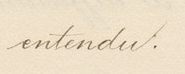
entendu:
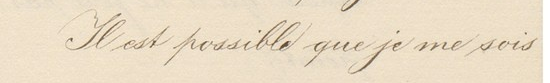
Il est possible que je me sois
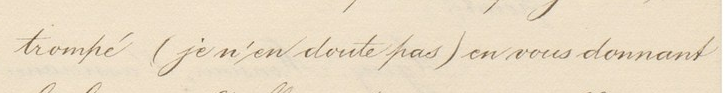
trompé (je n'en doute pas) en vous donnant
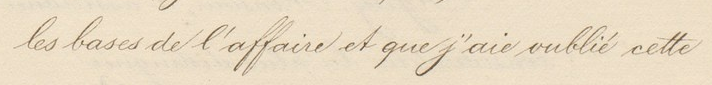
les bases de l'affaire et que j'aie oublié cette
